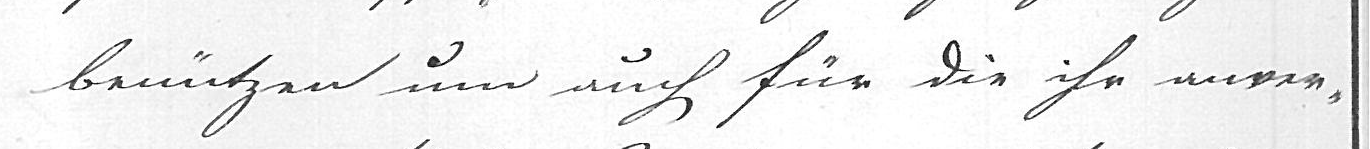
benützen um auch für die ihr anver
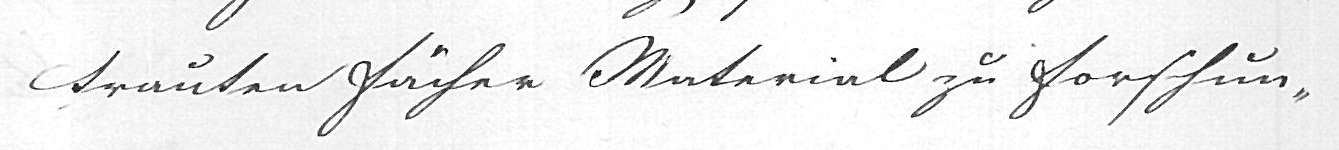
trauten Fächer Material zu Forschun-
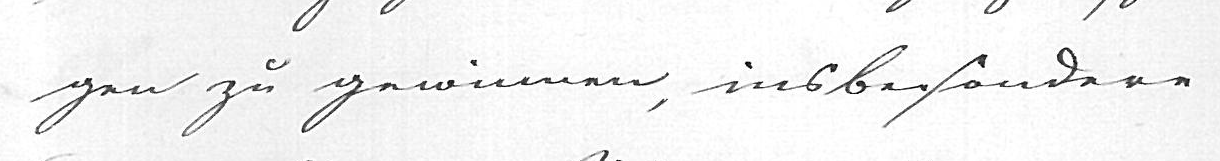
gen zu gewinnen, insbesondere
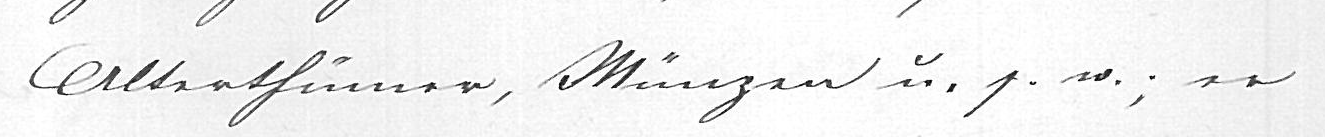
Alterthümer, Münzen u. s. w.; er
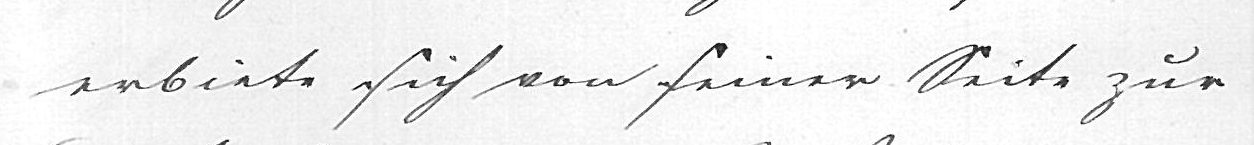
erbiete sich von seiner Seite zur
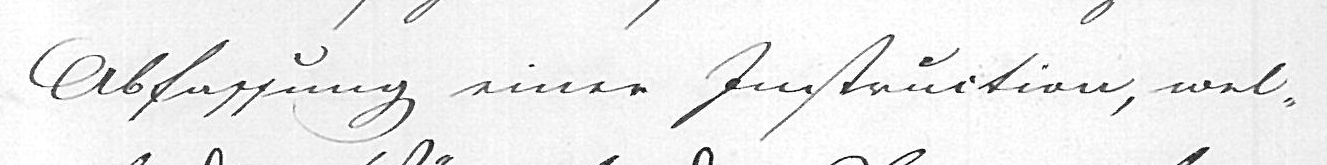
Abfassung einer Instruction, wel-
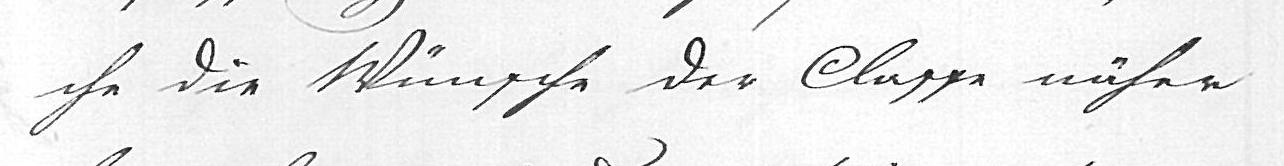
che die Wünsche der Classe näher
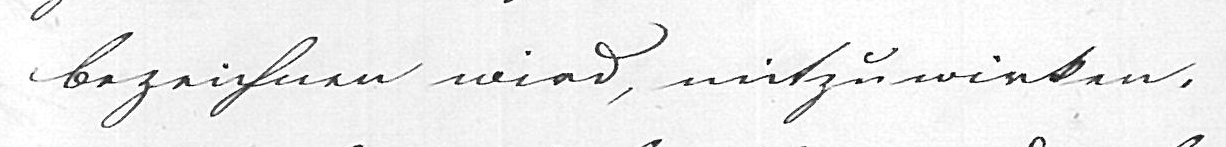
bezeichnen wird, mitzuwirken.
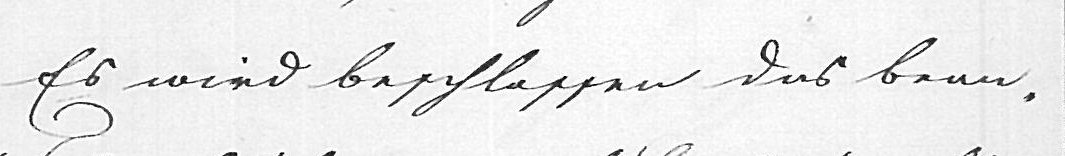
Es wird beschlossen das bean-
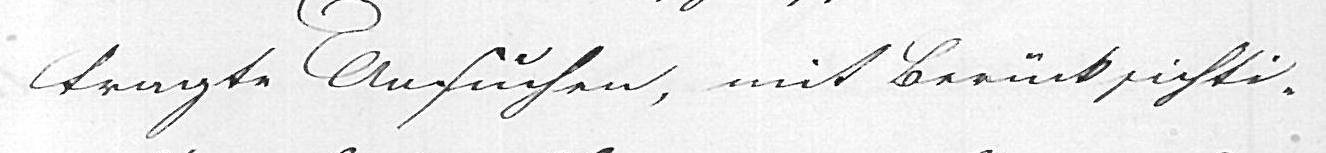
tragte Ansuchen, mit Berücksichti-
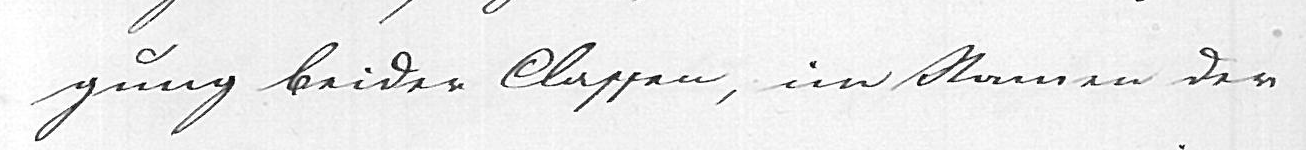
gung beiden Classen, im Namen der
